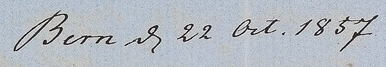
Bern den 22 Oct. 1857
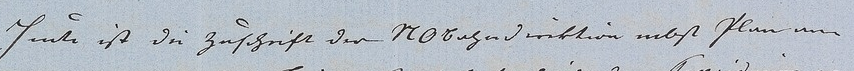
Heute ist die Zuschrift der NOBahndirektion nebst Plan an-
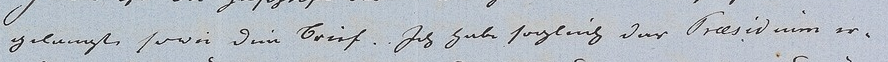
gelangt, sowie dein Brief. Ich habe sogleich das Præsidium er-
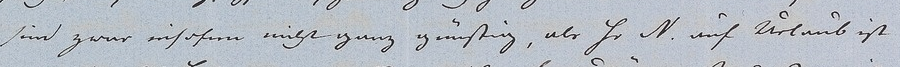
sind zwar insofern nicht ganz günstig, als Hr N. auf Urlaub ist
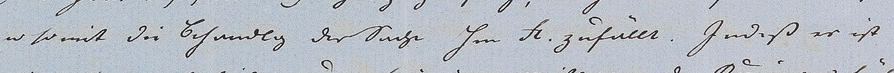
u somit die Behandlg der Sache Hrn St. zufällt. Indeß es ist
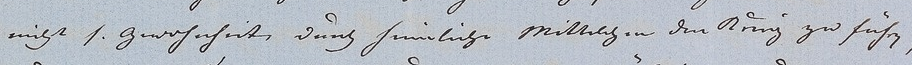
nicht s. Gewohnheit, durch heimliche Mittelchen den Krieg zu führen,
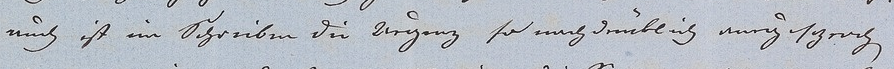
auch ist im Schreiben die Urgenz so nachdrücklich ausgesprochen
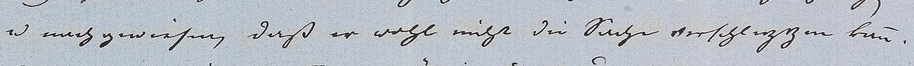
u nachgewiesen, daß er wohl nicht die Sache verschleppen kann.
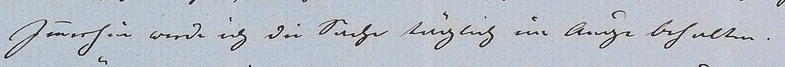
Immerhin werde ich die Sache täglich im Auge behalten.
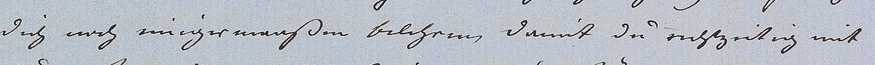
dich noch einigermaaßen belehren, damit du rechtzeitig mit
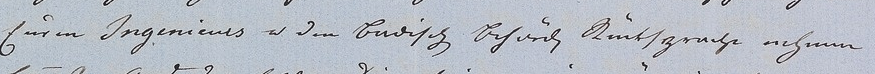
Euren Ingenieurs u den Badischen Behörden Rücksprache nehmen
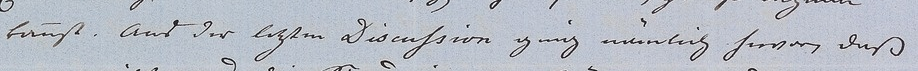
kannst. Aus der letzten Discussion ging nämlich hervor, daß
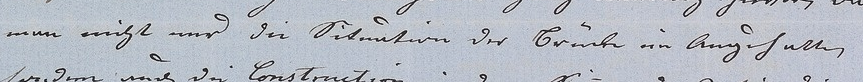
man nicht nur die Situation der Brücke im Auge halte,
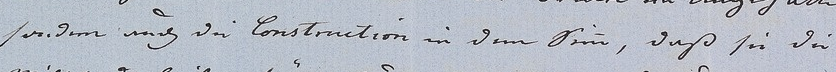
sondern auch die Construction in dem Sinne, daß sie die
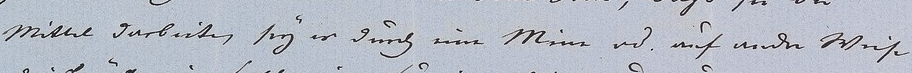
Mittel darbiete, sey es durch eine Mine od. auf andre Weise
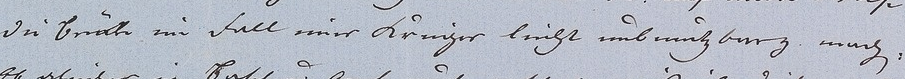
die Brücke im Fall eines Krieges leicht unbenutzbar z. machen:
